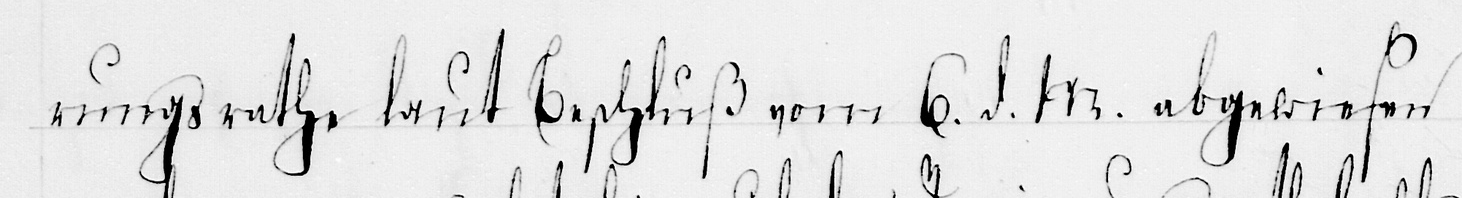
rungsrathe laut Beschluß vom 6. d. M. abgewiesen
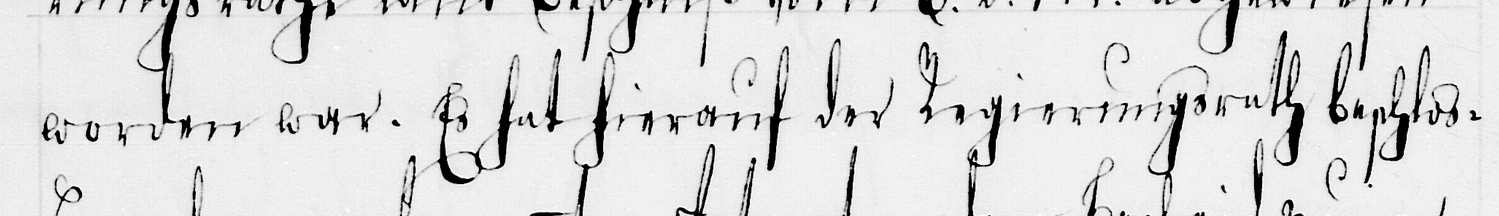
worden war. Es hat hierauf der Regierungsrath beschlo¬
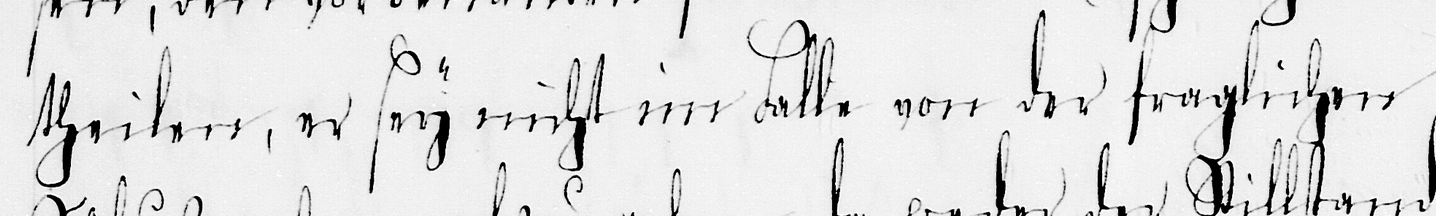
theilen, er sey nicht im Falle von der fraglichen
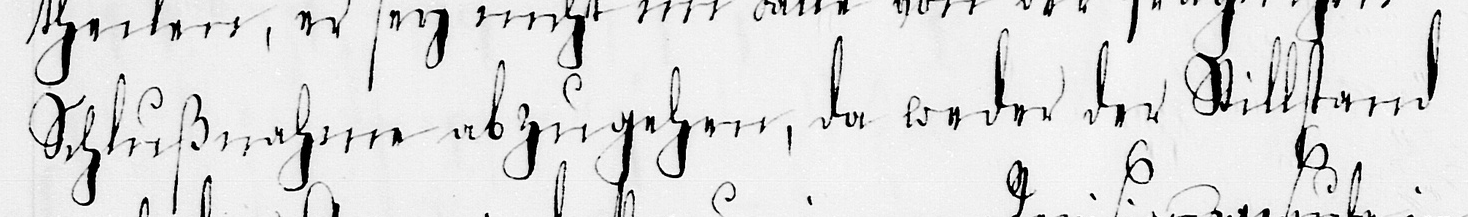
Schlußnahme abzugehen, da weder der Stillstand
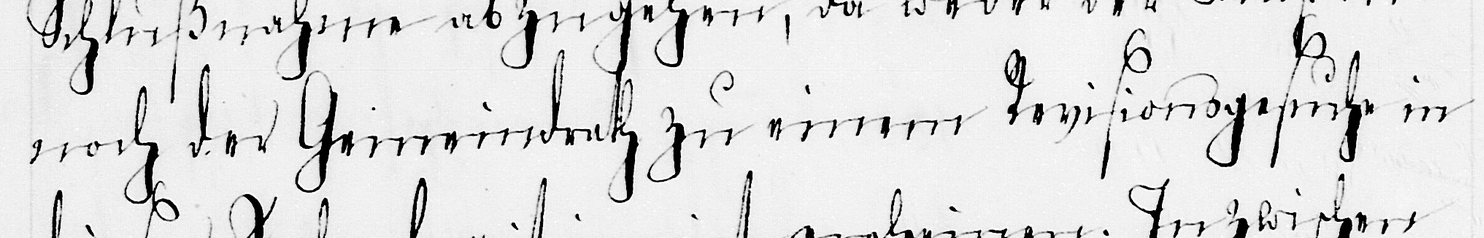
noch der Gemeindrath zu einem Revisionsgesuch in
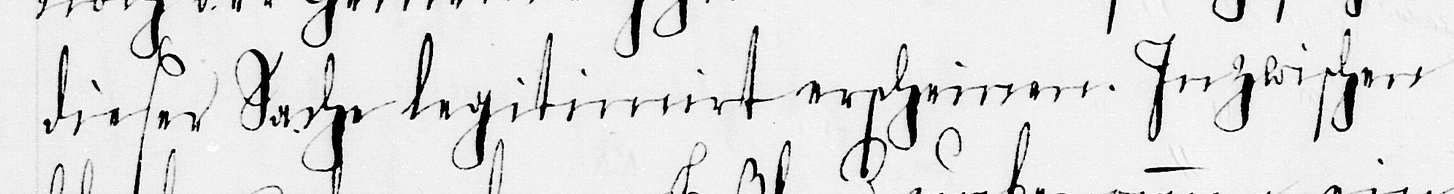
dieser Sache legitimirt erscheinen. Inzwischen
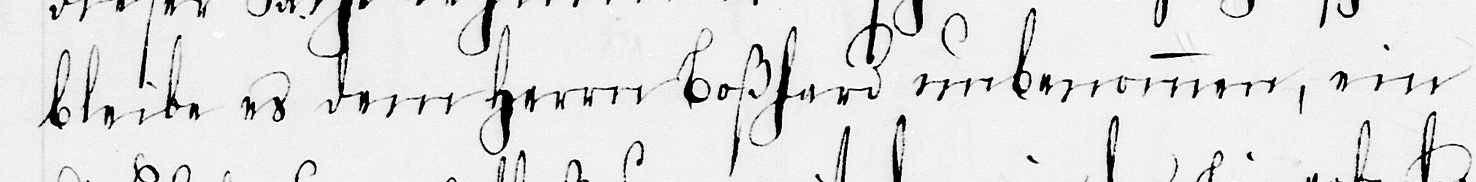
bleibe es dem Herrn Boßhard unbenommen, ein
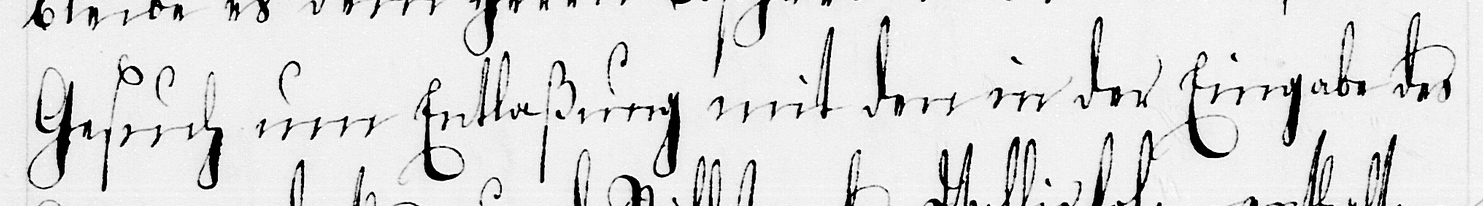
Gesuch um Entlaßung mit den in der Eingabe des
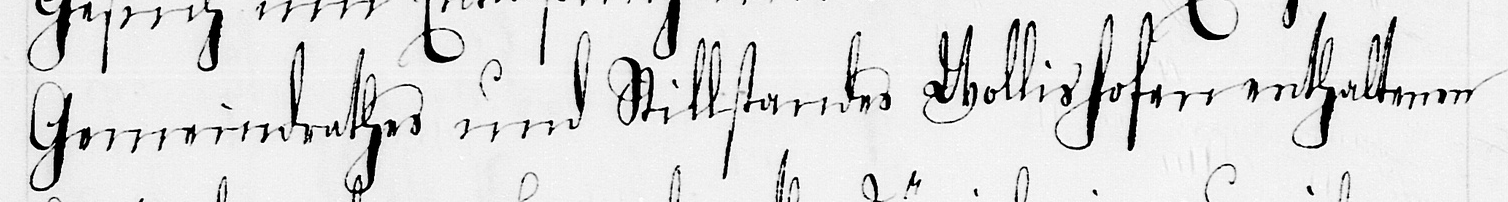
Gemeindrathes und Stillstandes Wollishofen enthaltenen
